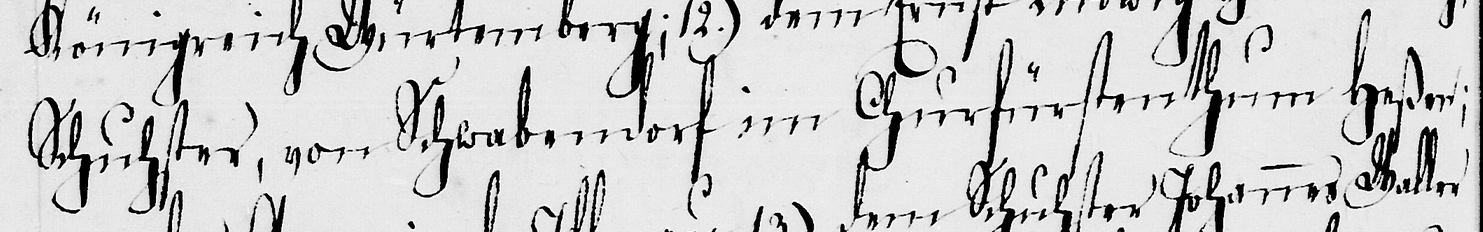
Schuhster, von Schwabendorf im Churfürstenthum Heßen;
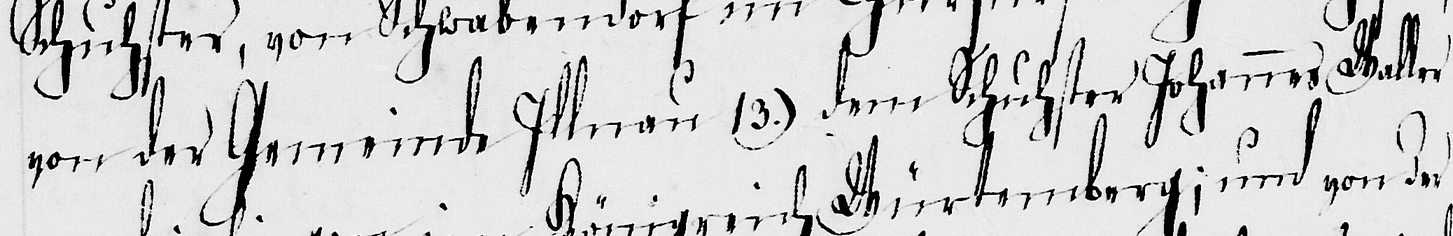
von der Gemeinde Illnau 13.) dem Schuhster Johannes Wal¬
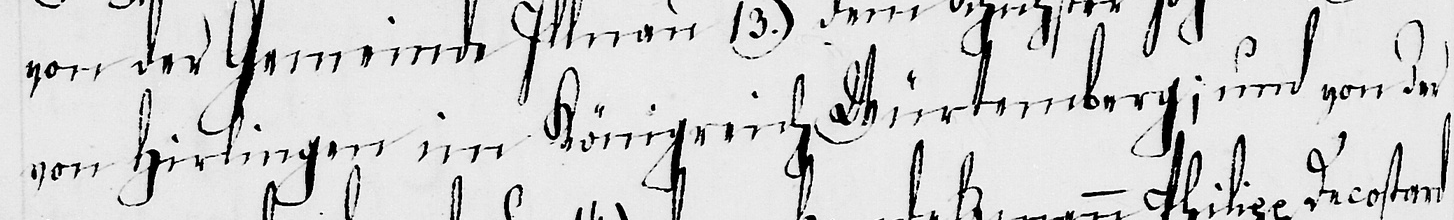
von Hirlingen im Königreich Würtemberg; und von der
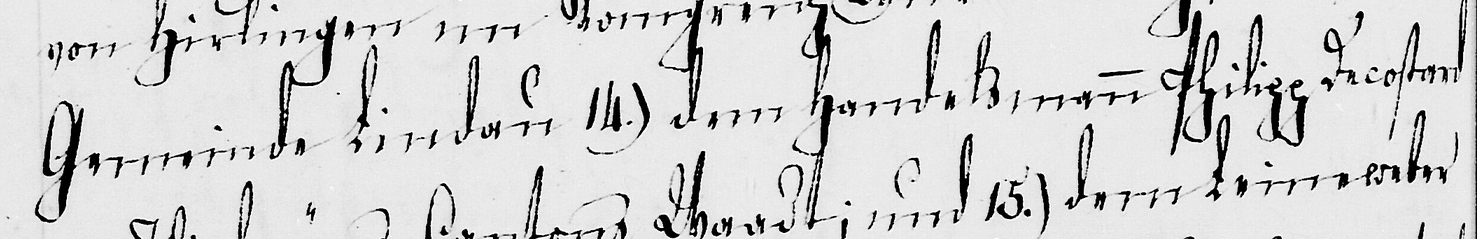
Gemeinde Lindau 14.) dem Handelsmann Philipp Decost¬
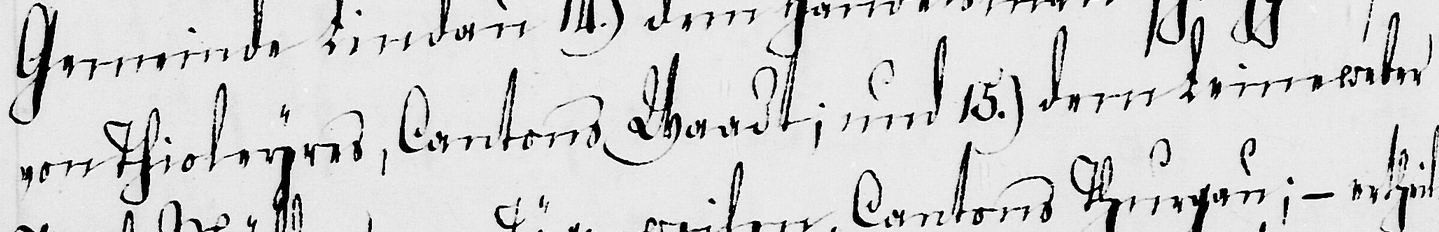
von Thioleyres, Cantons Waadt; und 15.) dem Leinenweber
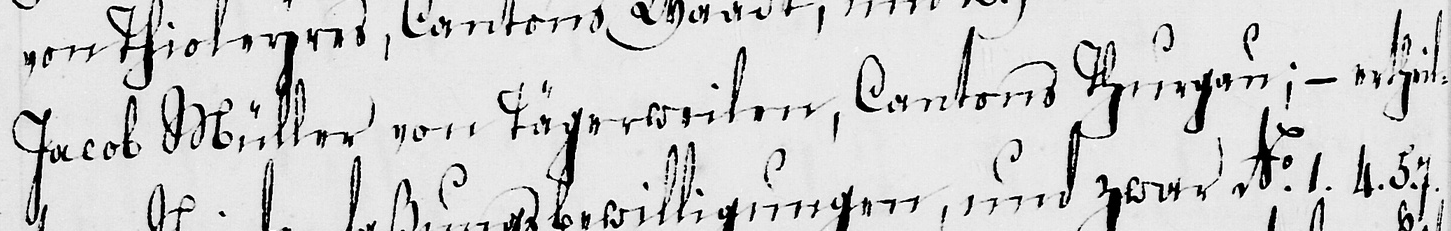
Jacob Müller von Tägerweilen, Cantons Thurgau; – erthei¬
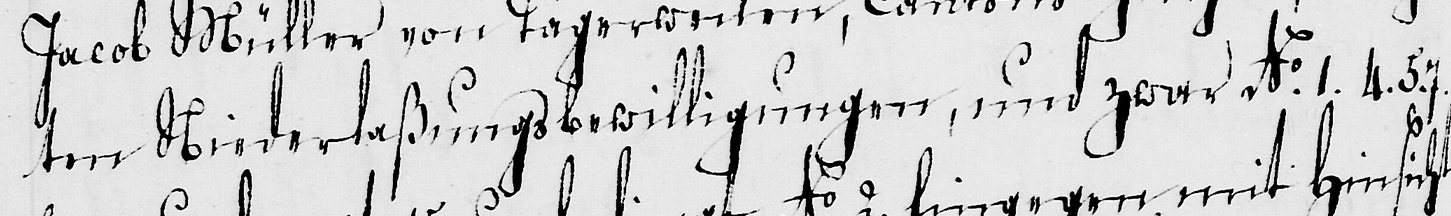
lten Niederlaßungsbewilligungen, und zwar No. 1. 4. 5.
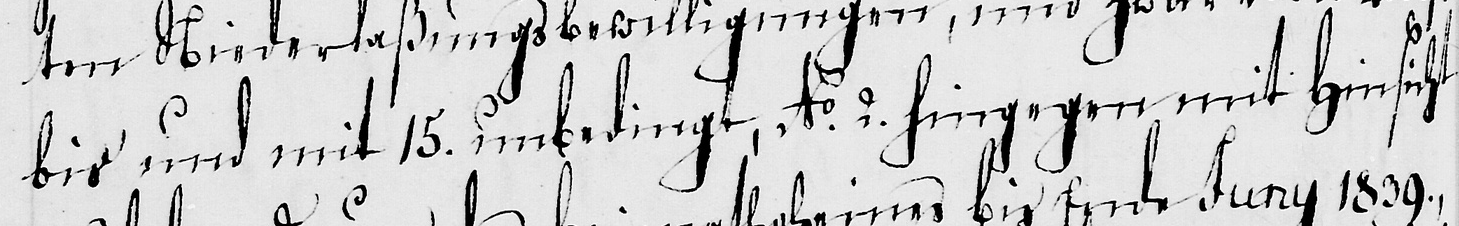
bis und mit 15. unbedingt, No. 2. hingegen mit Hinsi¬
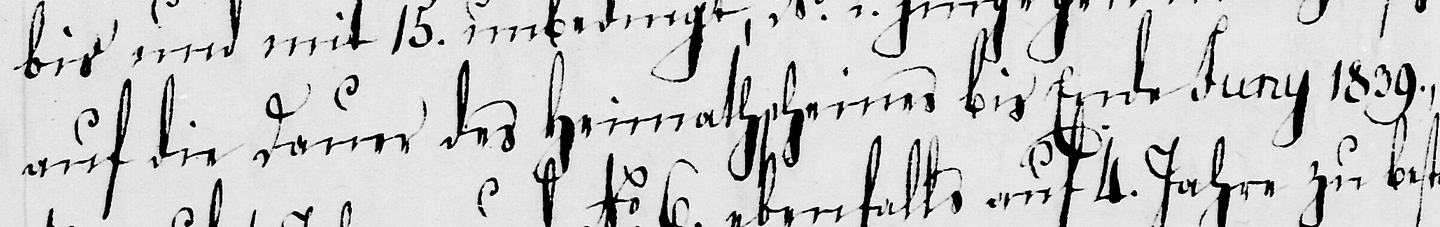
auf die Dauer des Heimathscheines bis Ende Juny 1839,
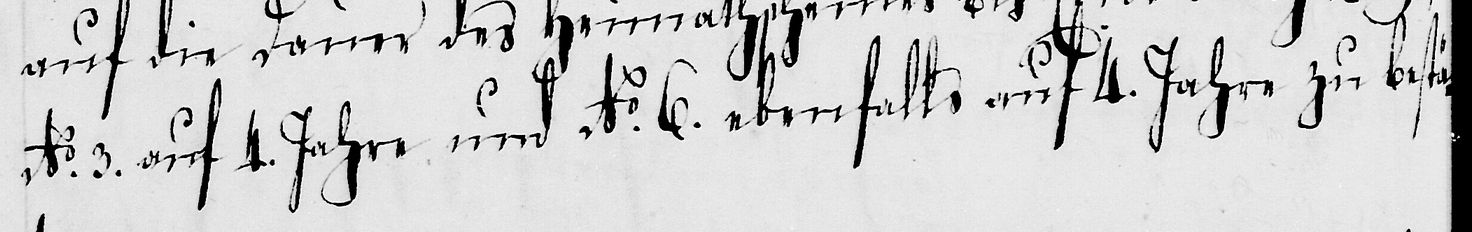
3. auf 4. Jahre und No. 6. ebenfalls auf 4. Jahre zu best¬
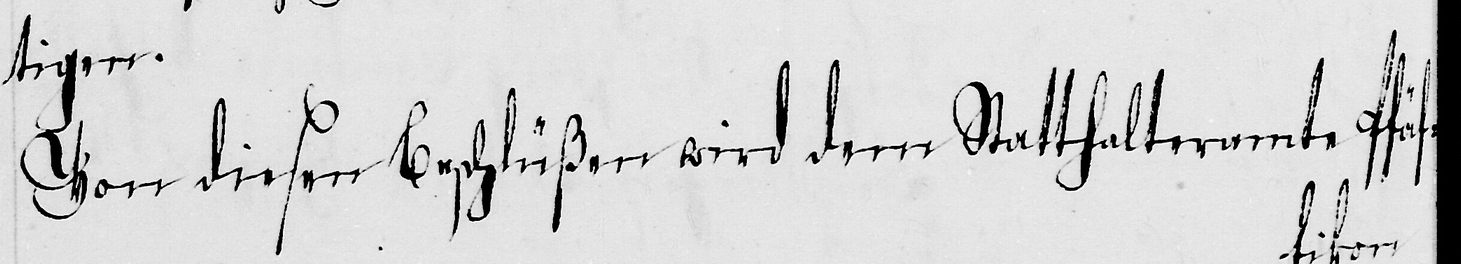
Von diesen Beschlüßen wird dem Statthalteramte Pfä¬
